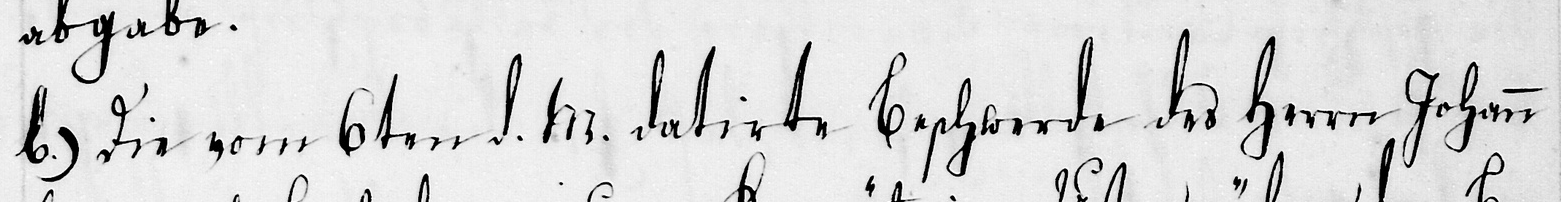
b.) Die vom 6ten d. M. datirte Beschwerde des Herrn Johann
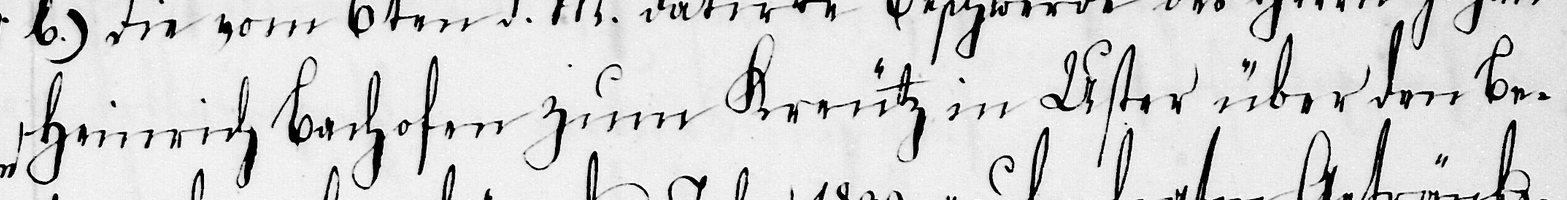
Heinrich Bachofen zum Kreutz in Uster über den Be¬
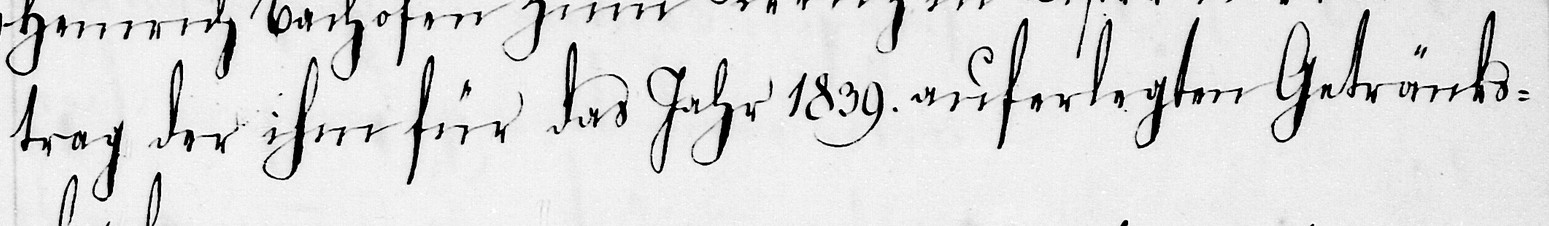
trag der ihm für das Jahr 1839. auferlegten Getränks¬
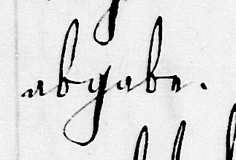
abgabe.
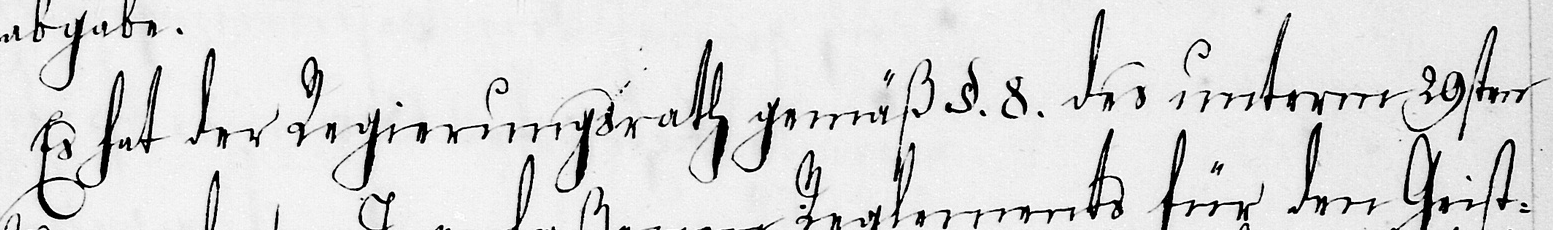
Es hat der Regierungsrath gemäß §. 8. des unterm 29sten
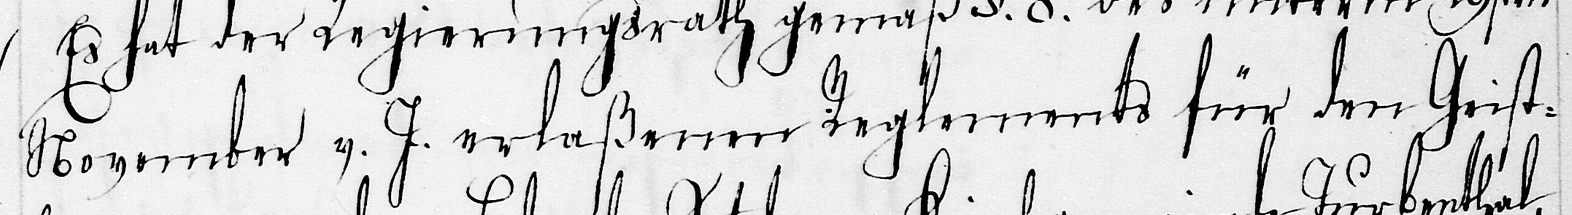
November v. J. erlaßenen Reglements für den Geist¬
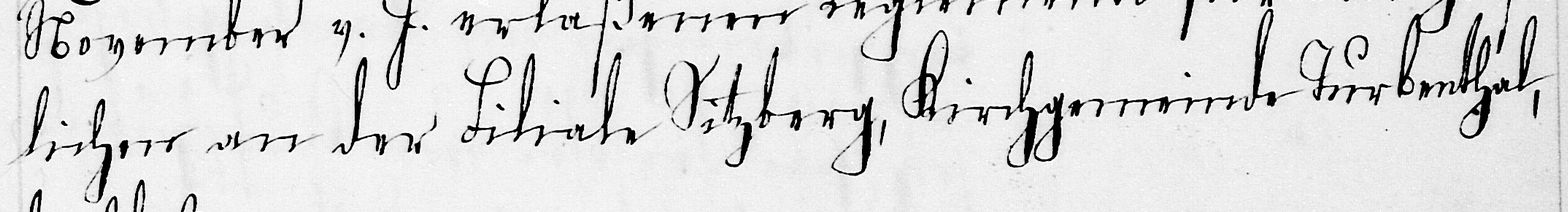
lichen an der Filiale Sitzberg, Kirchgemeinde Turbenthal,
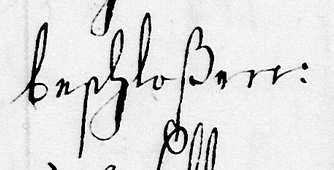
beschloßen:
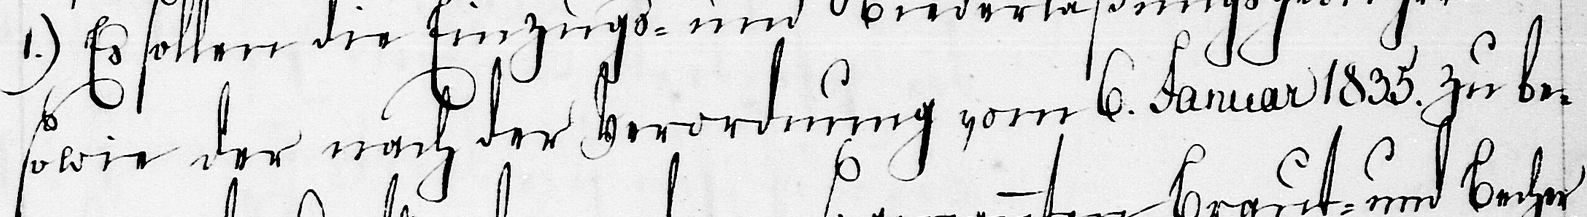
sowie der nach der Verordnung vom 6. Januar 1835. zu be¬
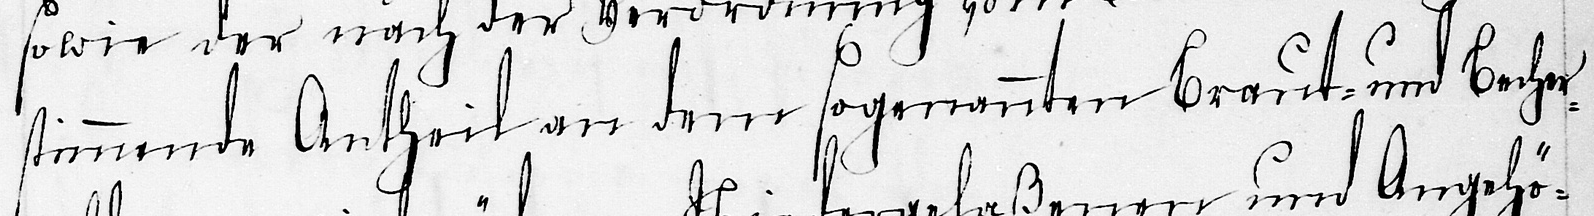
stimmende Antheil an dem sogenannten Braut- und Beche¬
